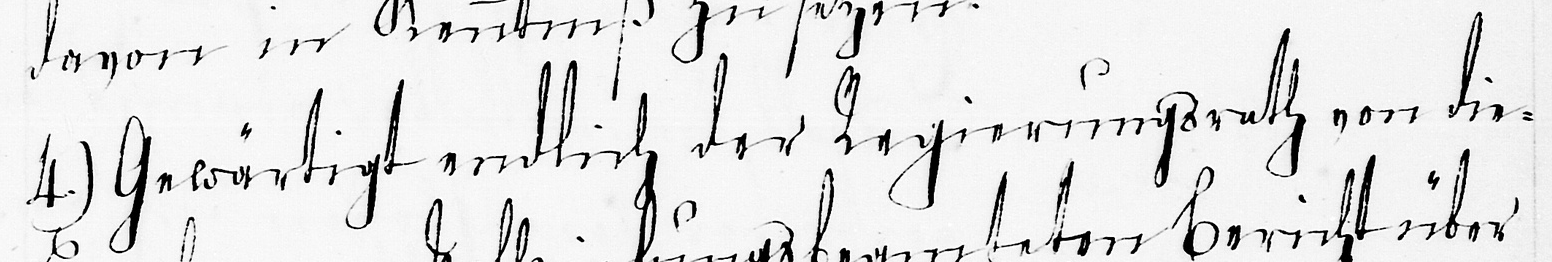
4.) Gewärtigt endlich der Regierungsrath von die¬
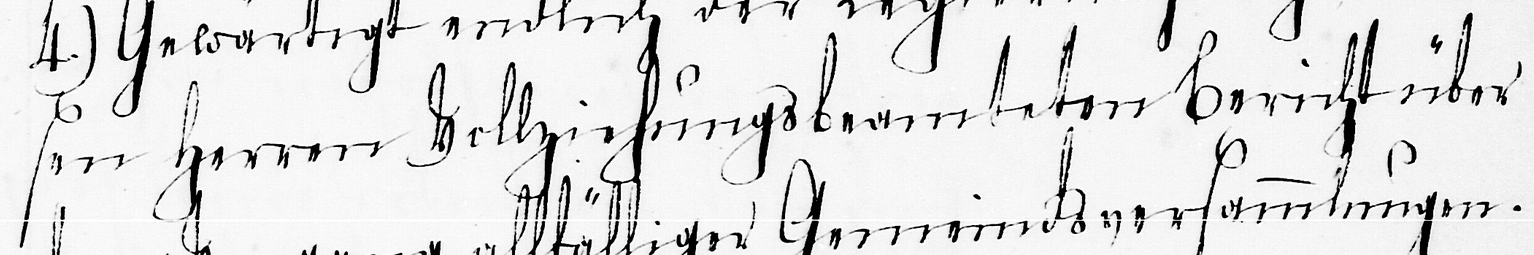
sen Herren Vollziehungsbeamteten Bericht über
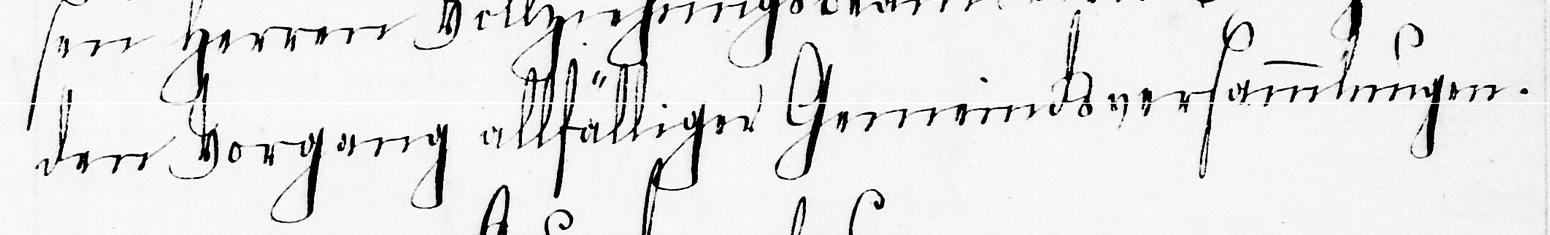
den Vorgang allfälliger Gemeindsversammlungen.
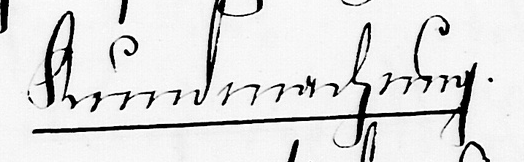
Kundmachung.
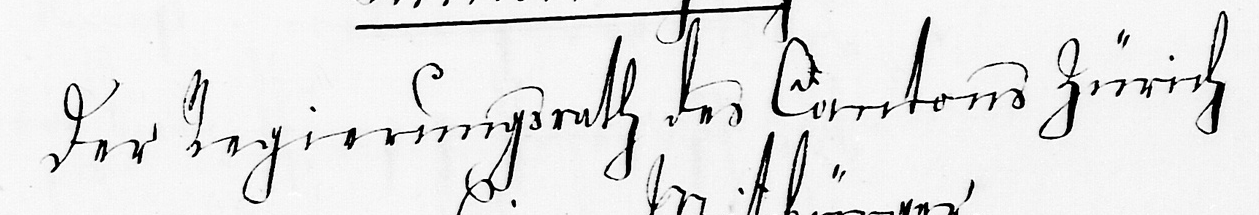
Der Regierungsrath des Cantons Zürich
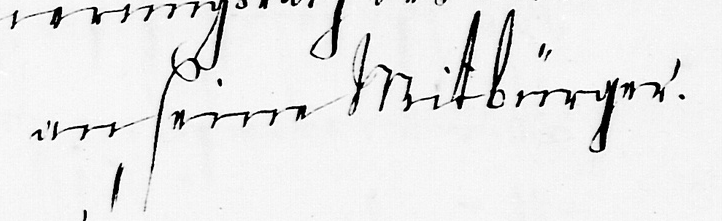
an seine Mitbürger.
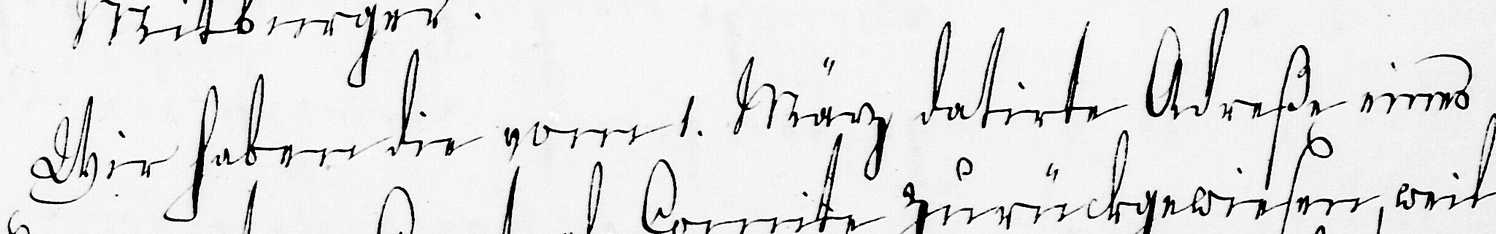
Wir haben die vom 1. März datirte Adreße eines
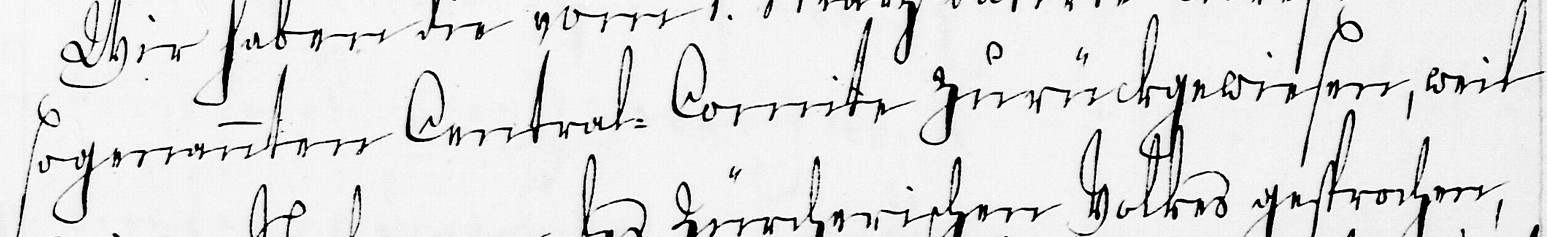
sogenannten Central-Comite zurückgewiesen, weil
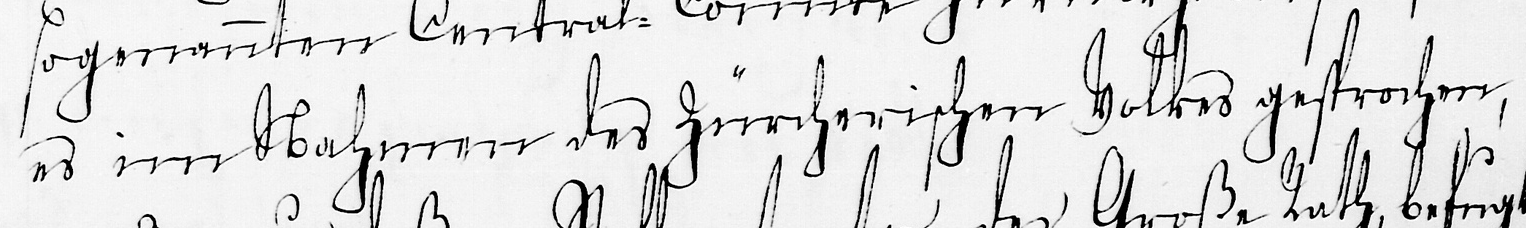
es im Nahmen des Zürcherischen Volkes gesprochen,
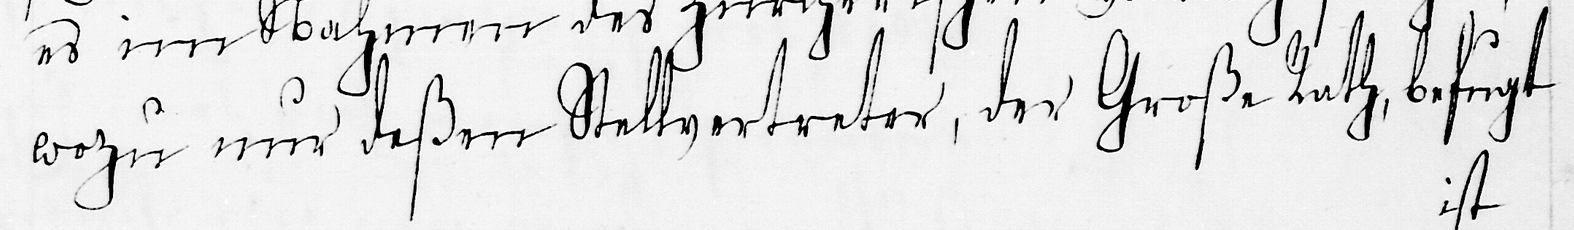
wozu nur deßen Stellvertreter, der Große Rath, befugt
